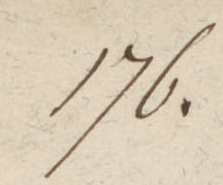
176.
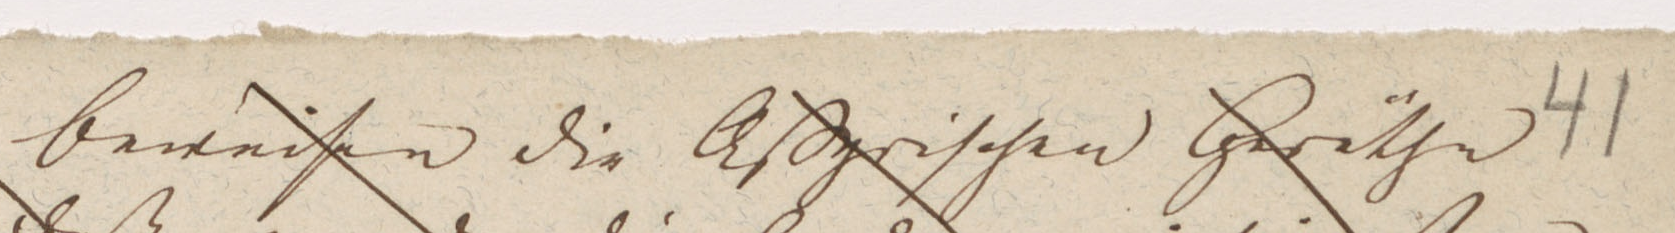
beweisen die Assyrischen Geräthe
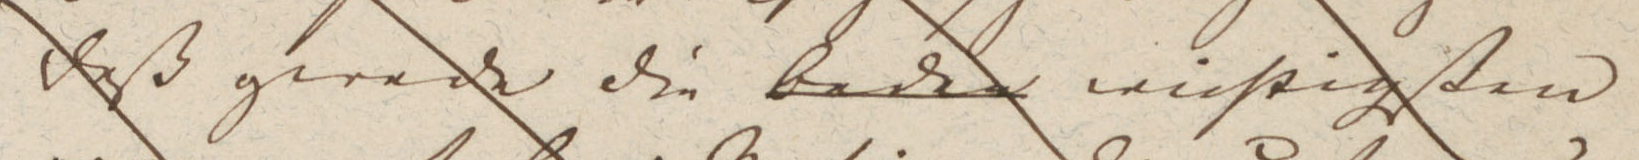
dass gerade die beden wichtigsten
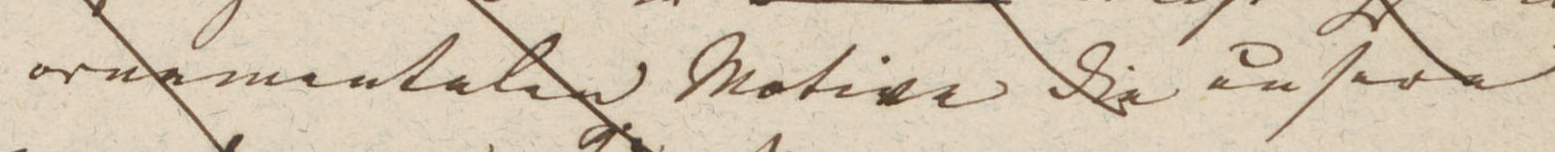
ornamentalen Motive die unsere
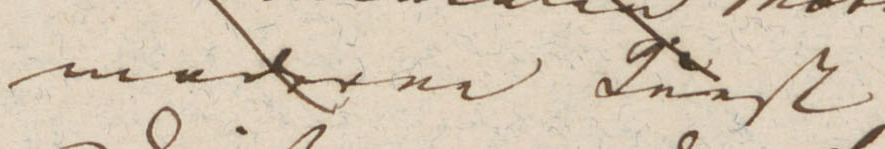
moderne Kunst
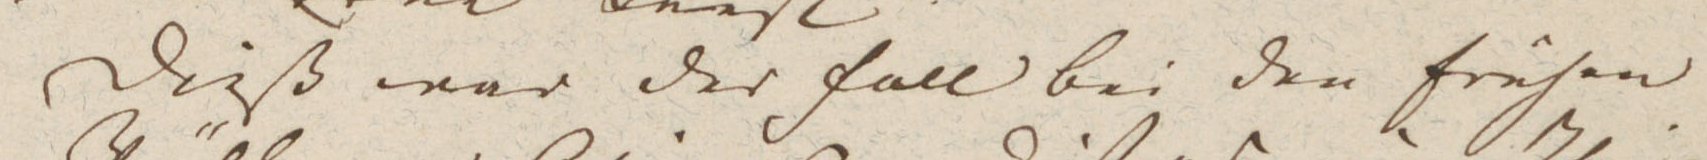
Diess war der Fall bei den frühen
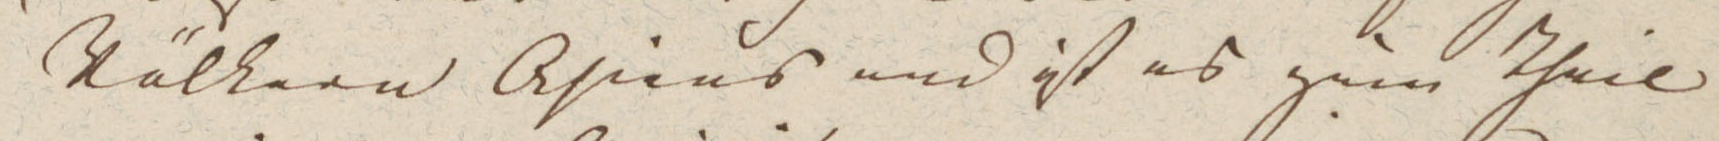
Völkern Asiens und ist es zum Theil
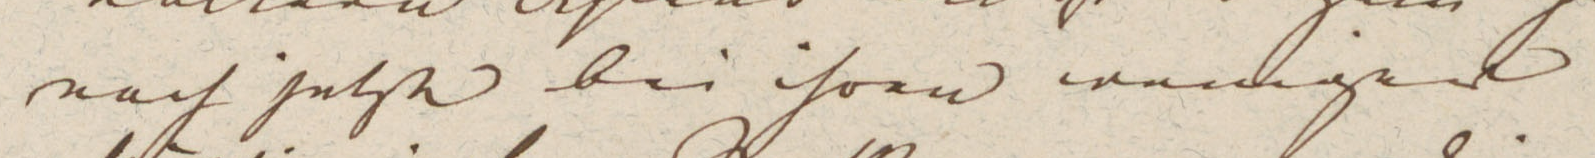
noch jetzt bei ihren weniger
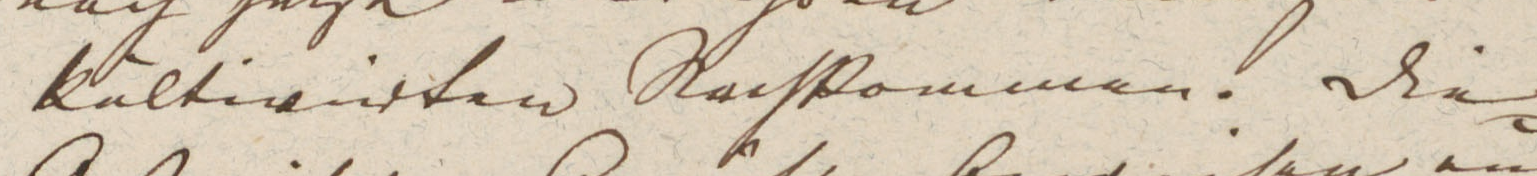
kultivirten Nachkommen. Die
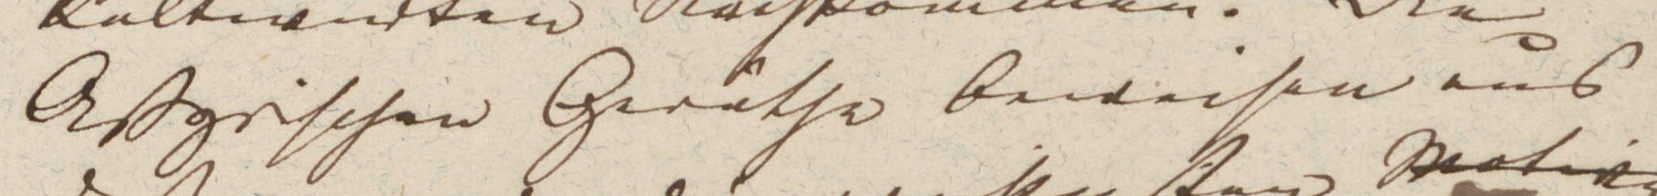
Assyrischen Geräthe beweisen uns
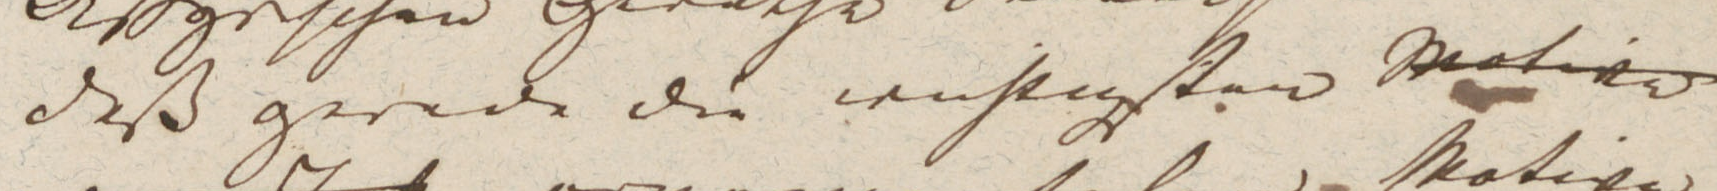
dass gerade die wichtigsten Motive
